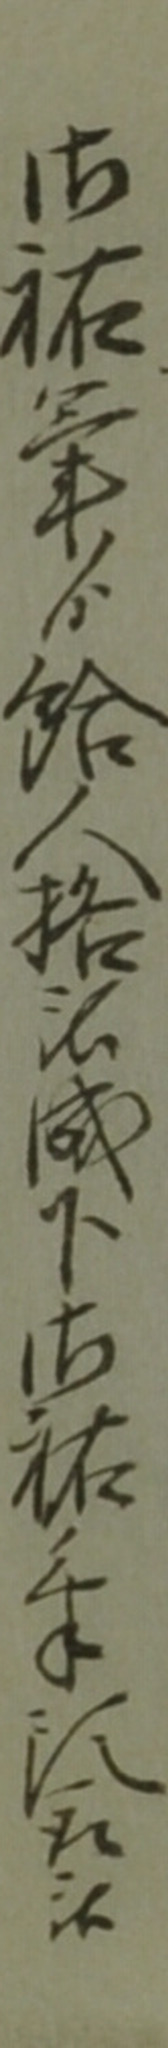御祐筆より給人格被成下御祐筆頭取被
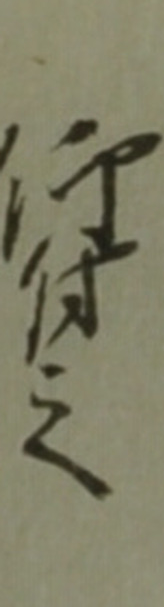仰付之
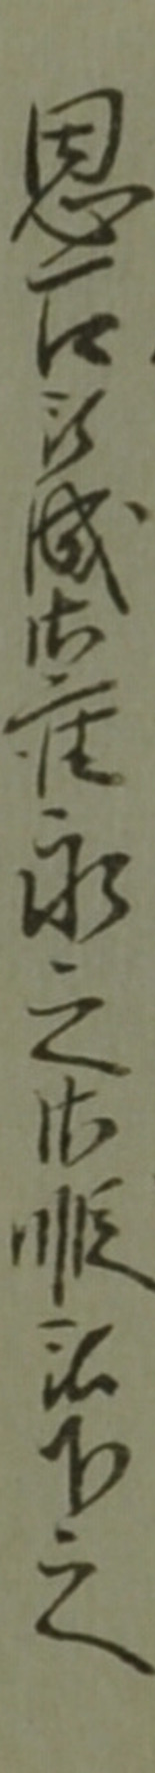思召被成御座永之御暇被下之
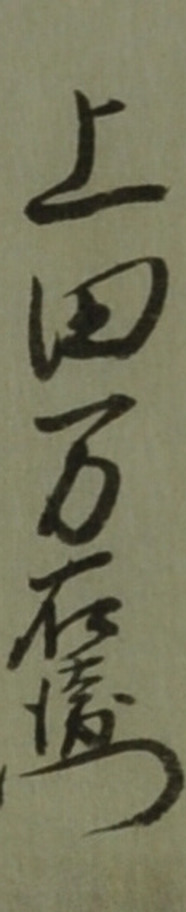上田万右衛門
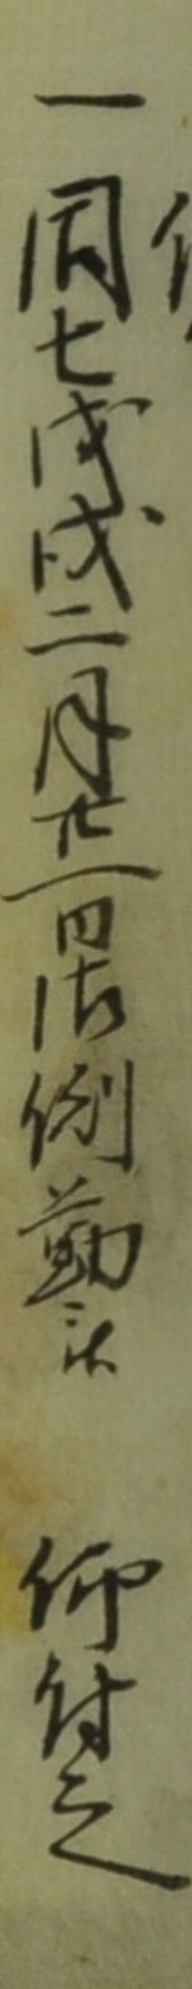一同七戊戌二月廿一日御側勤被仰付之
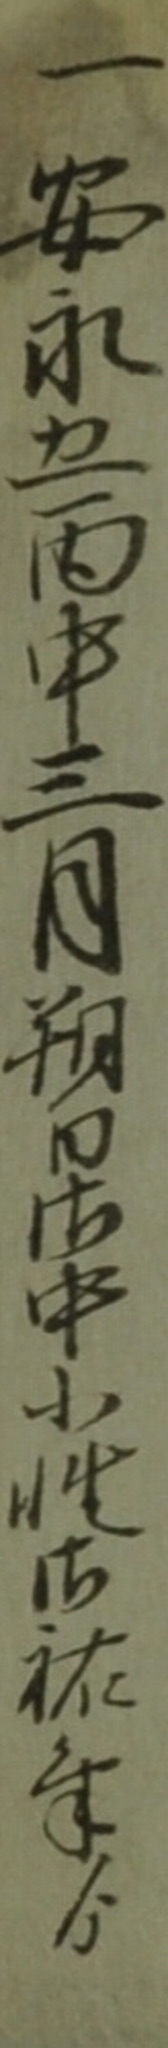一安永五丙申三月朔日御中小姓御祐筆より
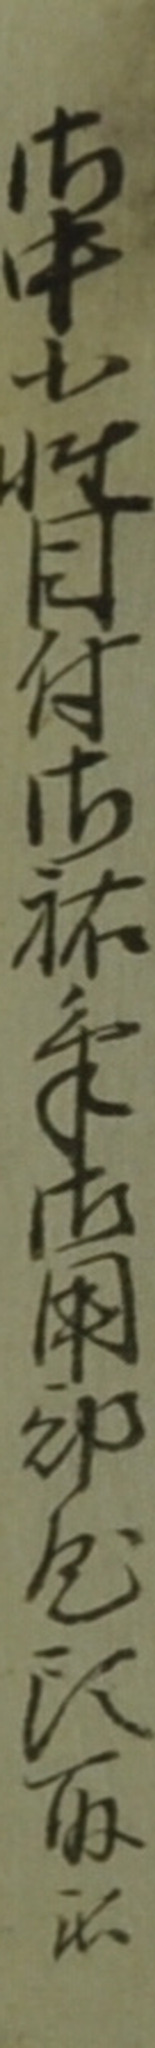御中小姓目付御祐筆御用部屋頭取被
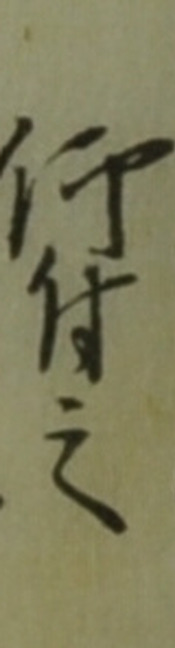仰付之
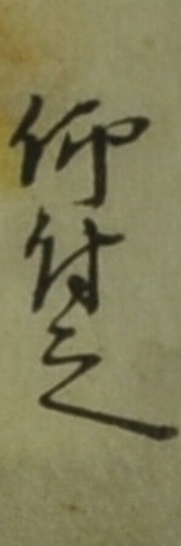仰付之

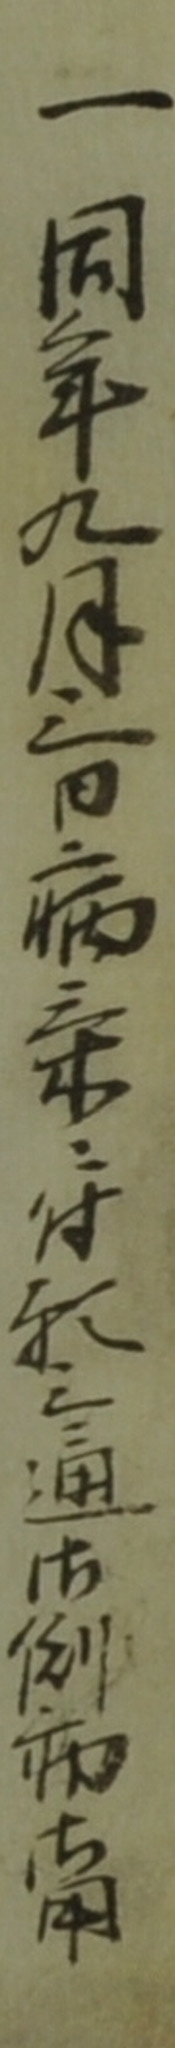一同年九月三日病気ニ付願之通御側勤御用
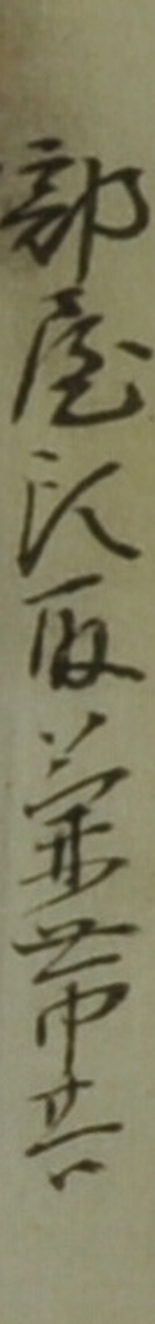部屋頭取兼帯共
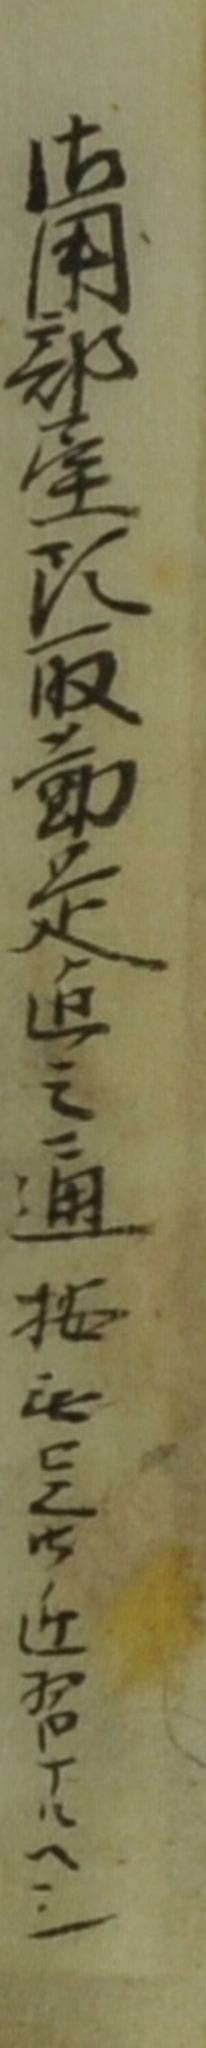御用部屋頭取勤是迄之通按無足御近習ナルヘシ
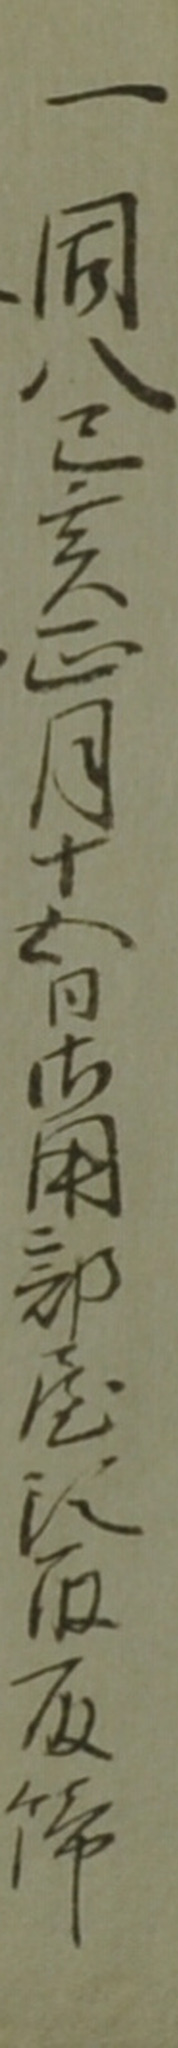一同八己亥正月十五日御用部屋頭取取締
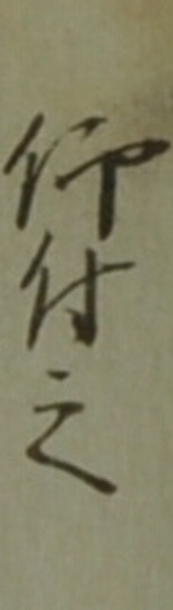仰付之
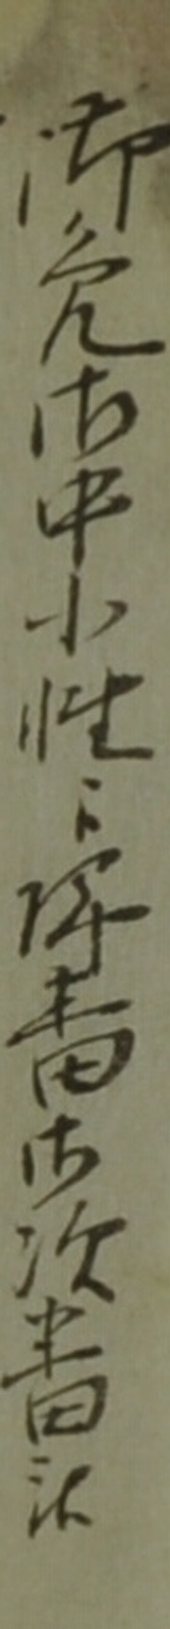御免御中小姓へ降番御次番被
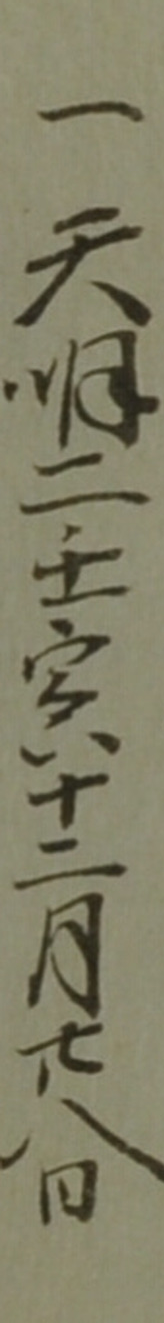一天明二壬寅十二月廿八日
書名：諸御役代々録（八）
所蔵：伊那市立高遠町図書館・合同会社AMANE
